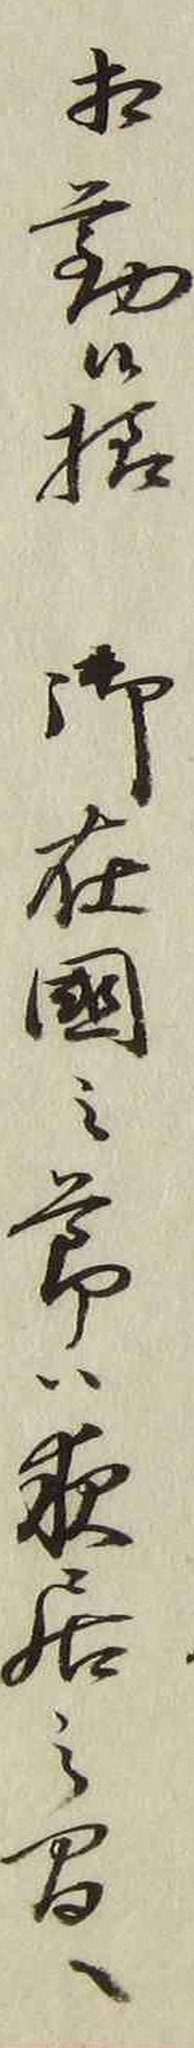相勤候様御在国之節は夜居之間へ
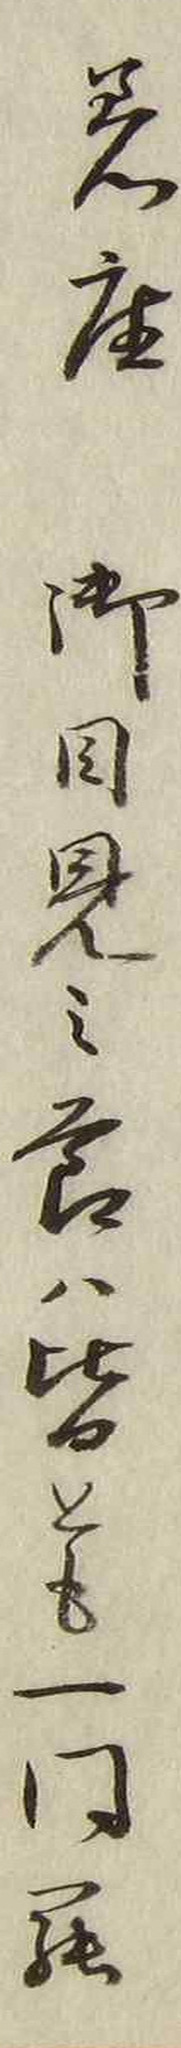着座御目見之節は皆とも一同罷
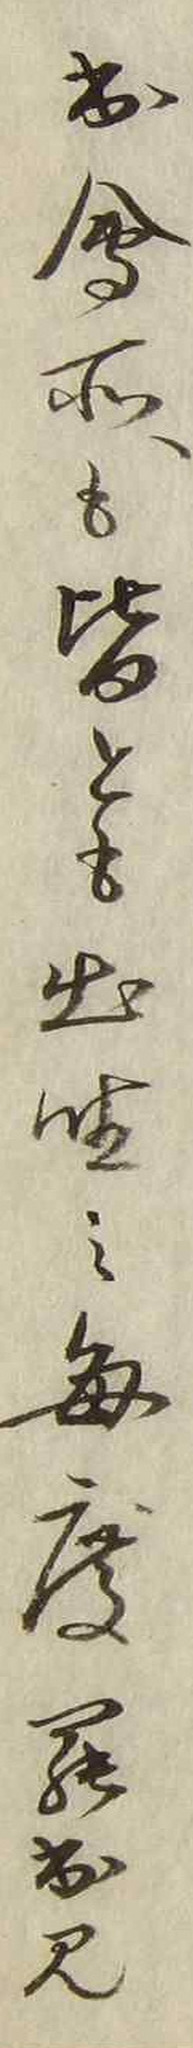出会所へも皆とも出坐之毎度罷出見

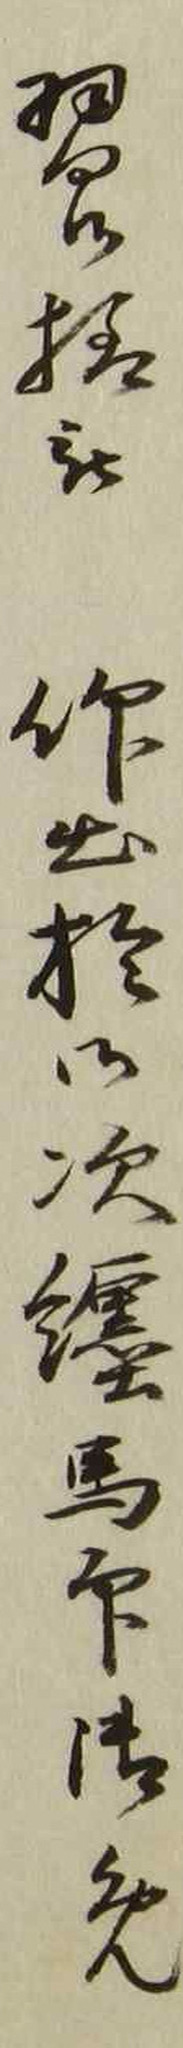習候様被仰出於御次纏馬印御免
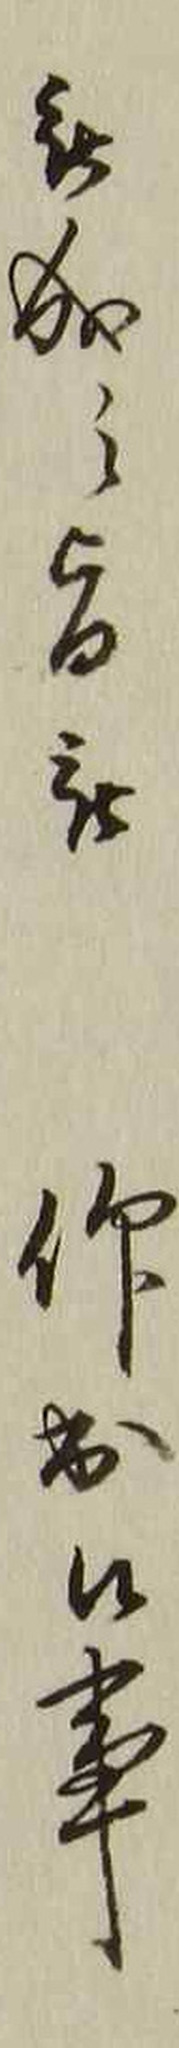被成之旨被仰出候事
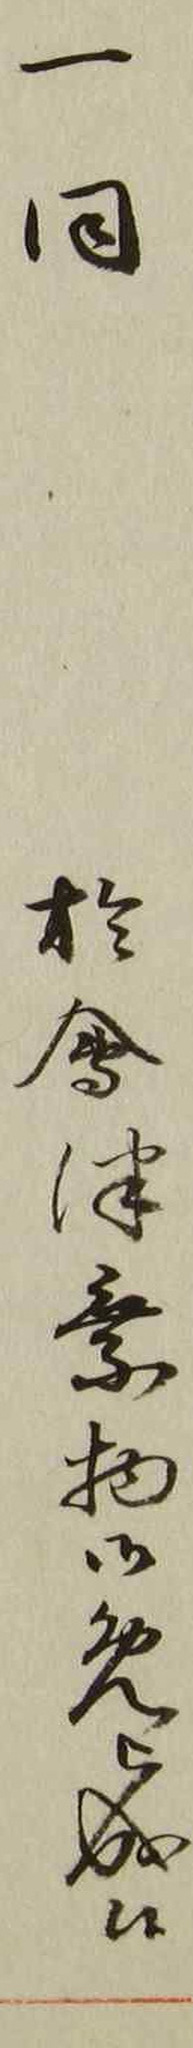一同於会津乗物御免被成候
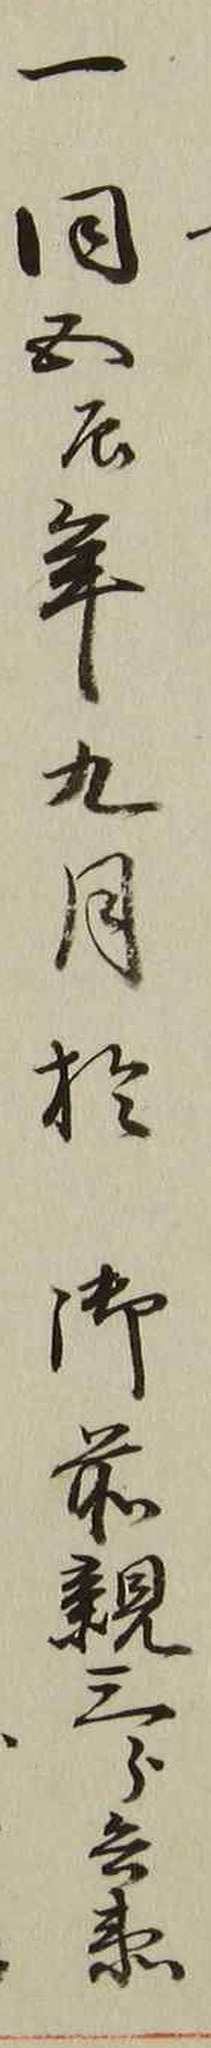一同五辰年九月於御前親三郎兵衛
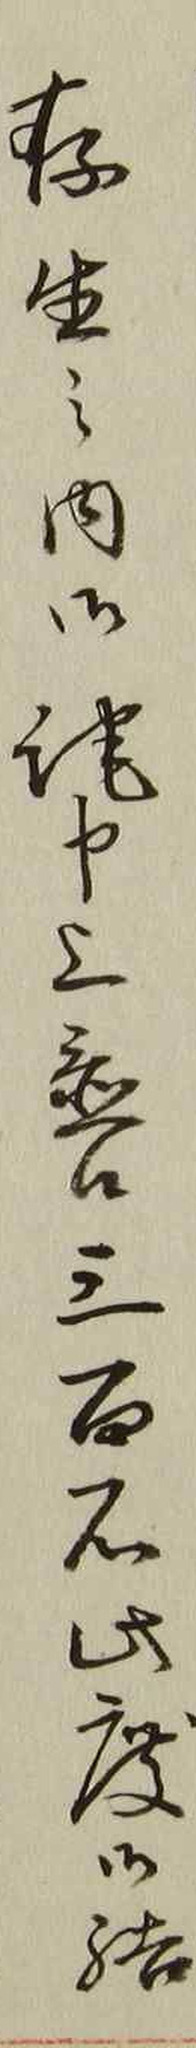存生之内御詫申上置候三百石此度御結
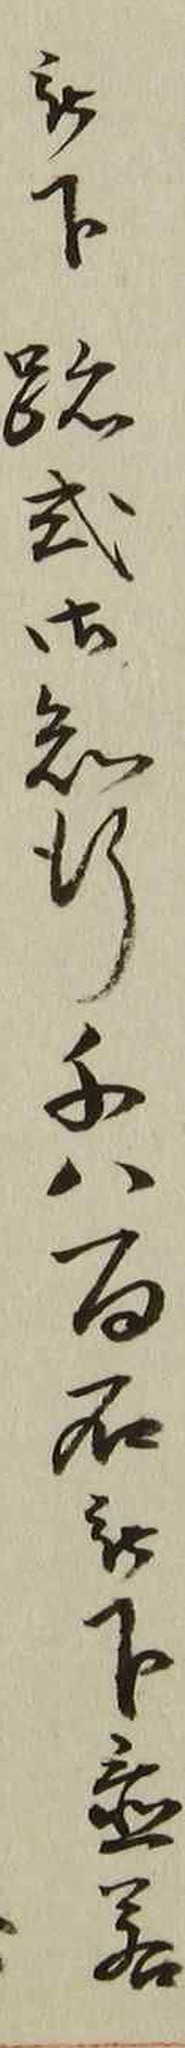被下跡式御知行千八百石被下置若
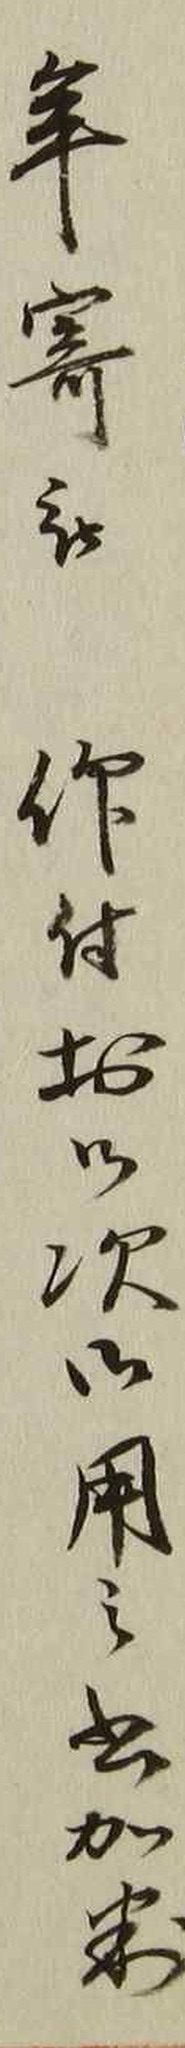年寄被仰付於御次御用之書加判
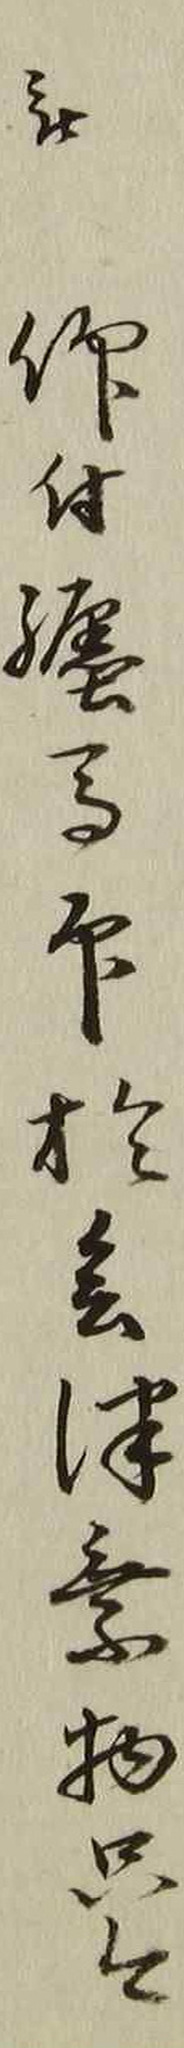被仰付纏馬印於会津乗物只今
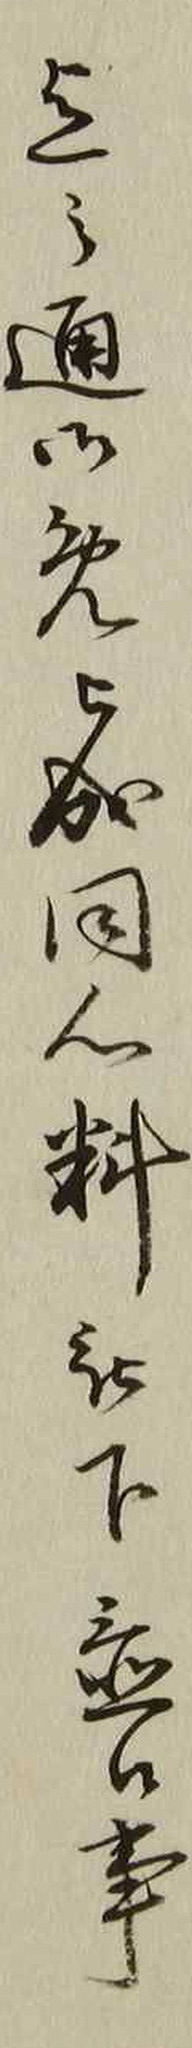迄之通御免被成同心料被下置候事
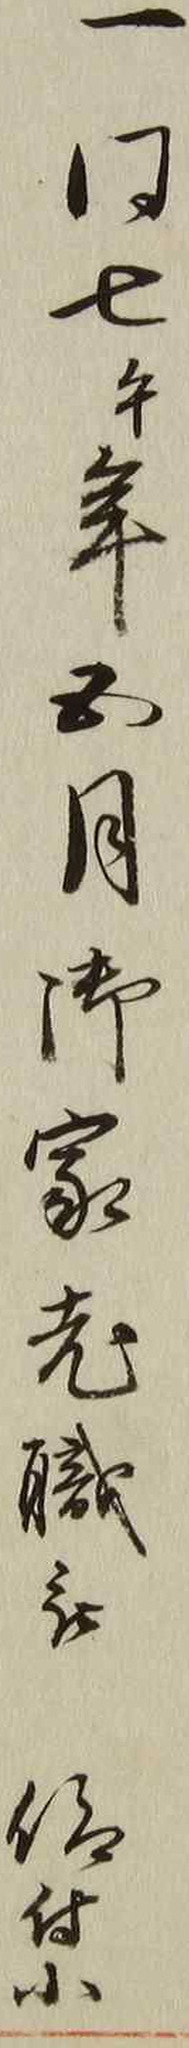一同七午年五月御家老職被仰付小
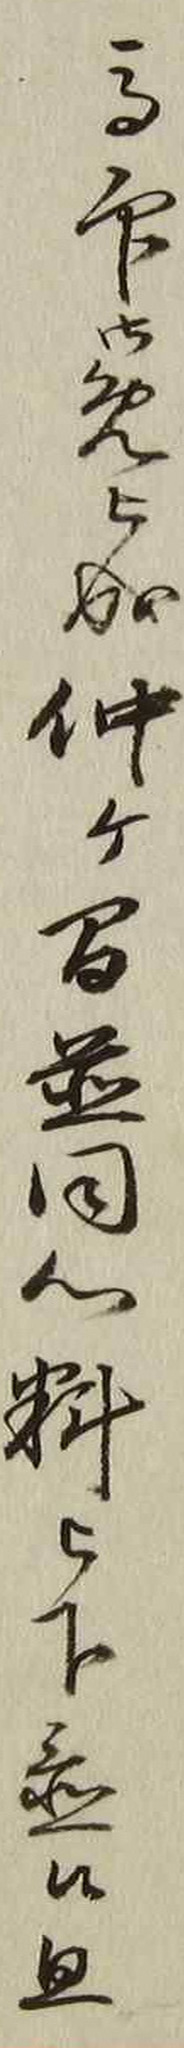馬印御免被成仲け間並同心料被下置候且
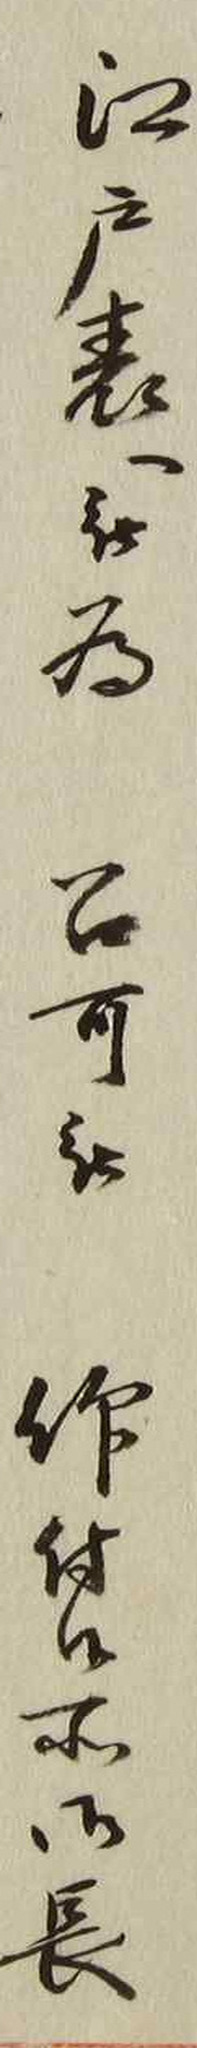江戸表へ被為召可被仰付候所御長
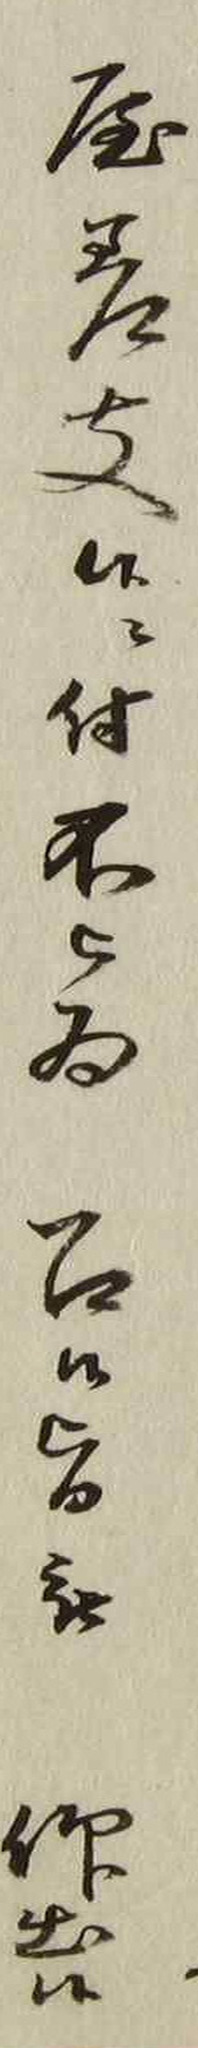屋差支候に付不被為召候旨被仰出候
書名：諸士系譜　巻之125　た之部1
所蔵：会津若松市立会津図書館
